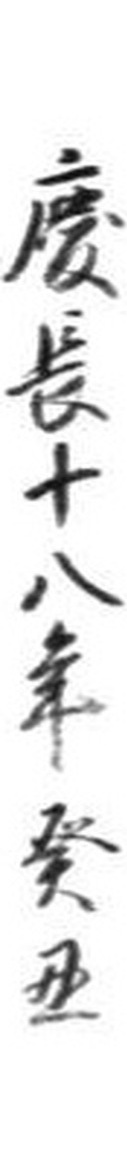慶長十八年癸丑
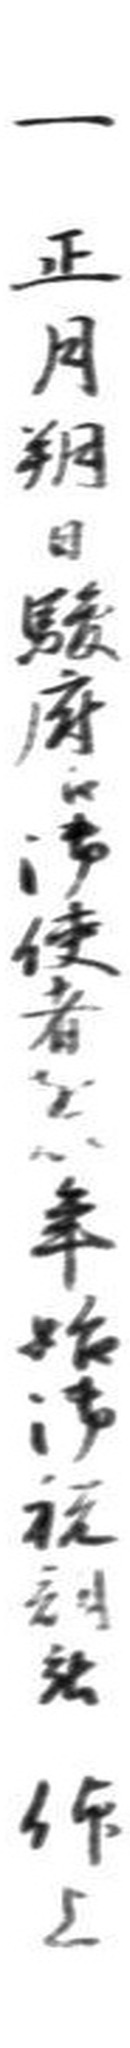一正月朔日駿府江御使者を以年始御祝詞被仰上
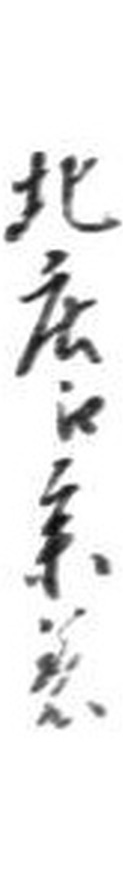北庄江参着

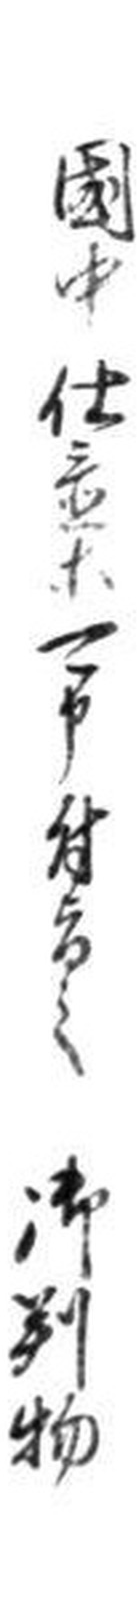国中仕置等可申付旨之御判物
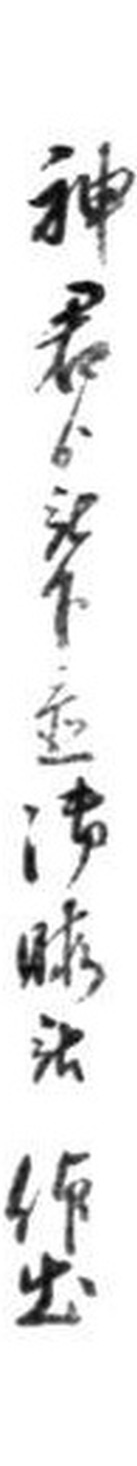神君ゟ被下置御暇被仰出
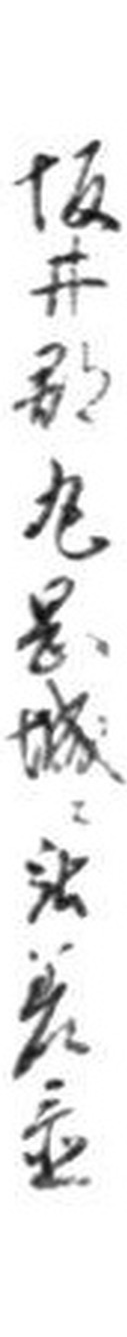坂井郡丸岡城ニ被差置
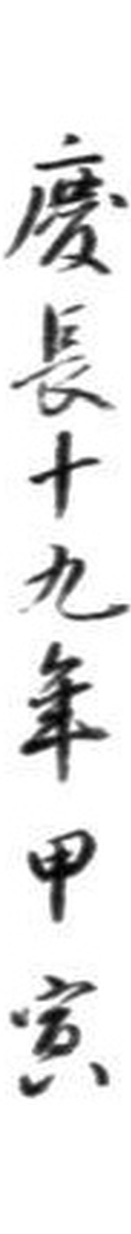慶長十九年甲寅
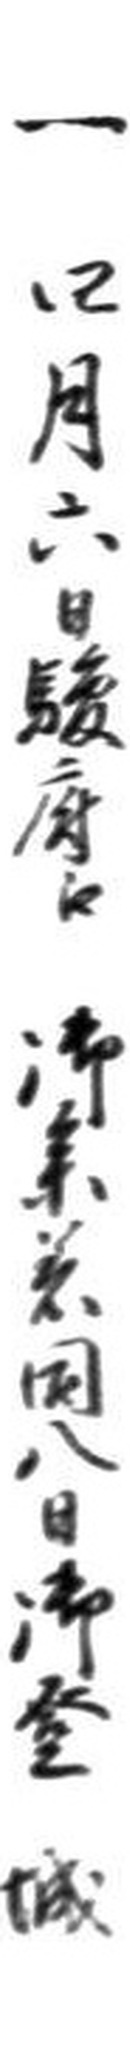一四月六日駿府江御参着同八日御登城
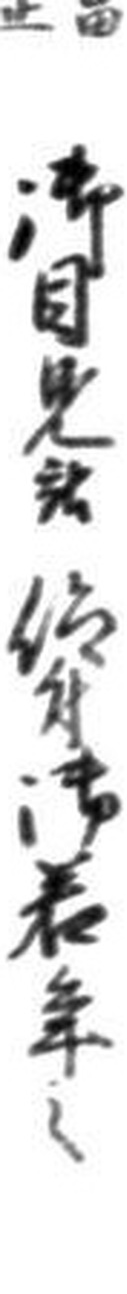正御目見被仰付御若年之
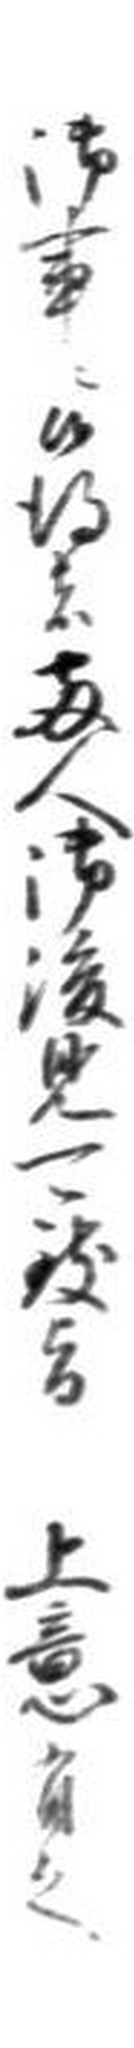御事ニ候得者両人御後見可致旨上意有之
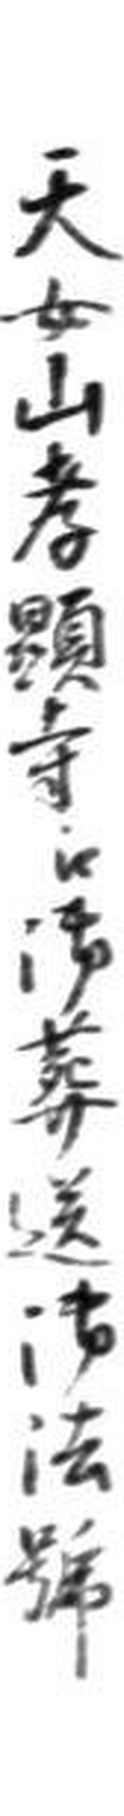天女山孝顕寺江御葬送御法号
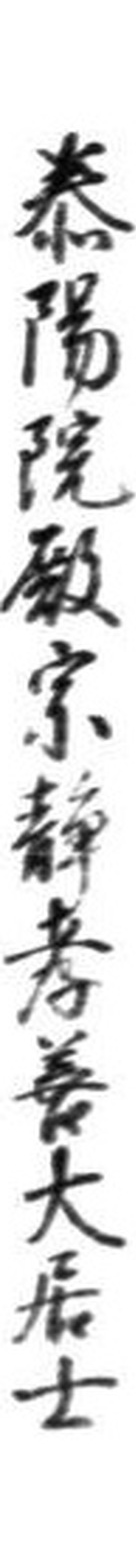泰陽院殿宗静孝善大居士

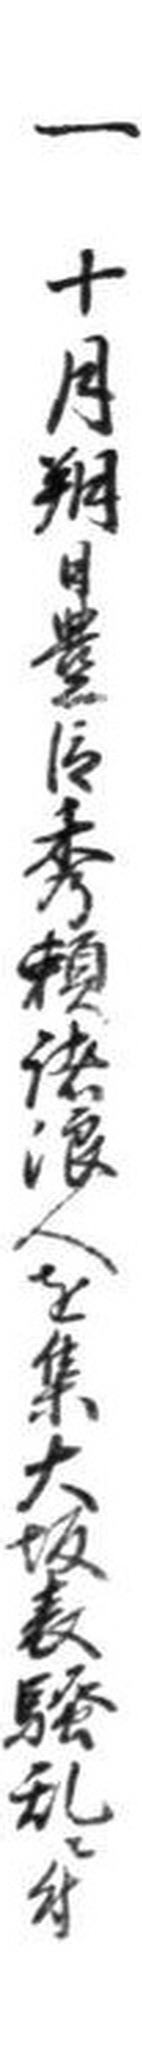一十月朔日豊臣秀頼諸浪人を集大坂表騒乱ニ付
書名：家譜 二 忠直公 従文禄四年到慶安四年
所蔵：福井県文書館 Fukui Prefectural Archives
